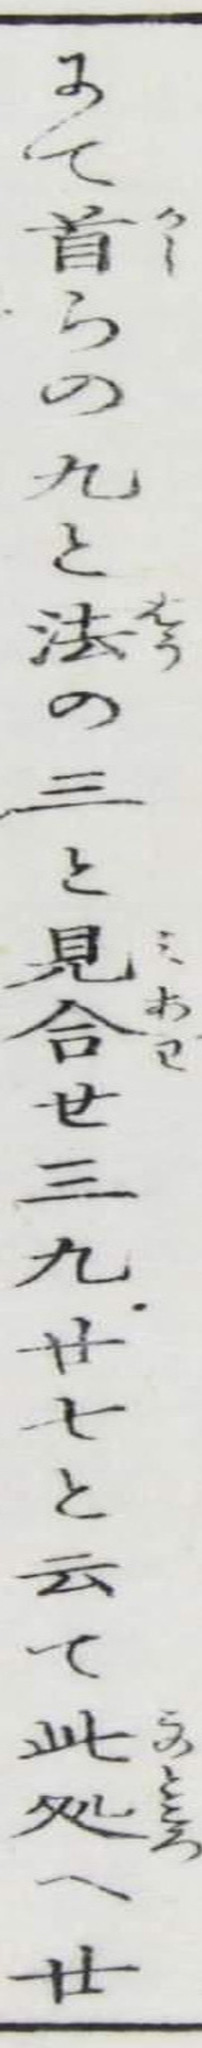にて首らの九と法の三と見合せ三九．廿七と云て此処へ廿
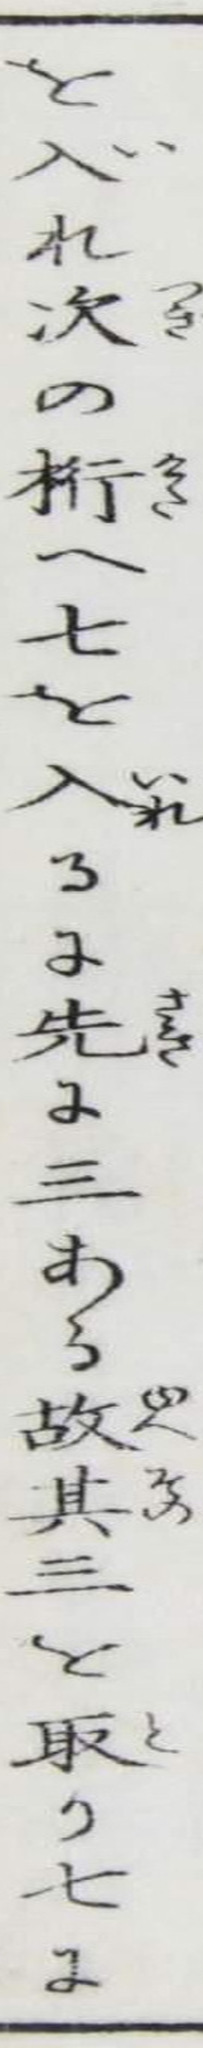を入れ次の桁へ七を入るに先に三ある故其三を取り七に
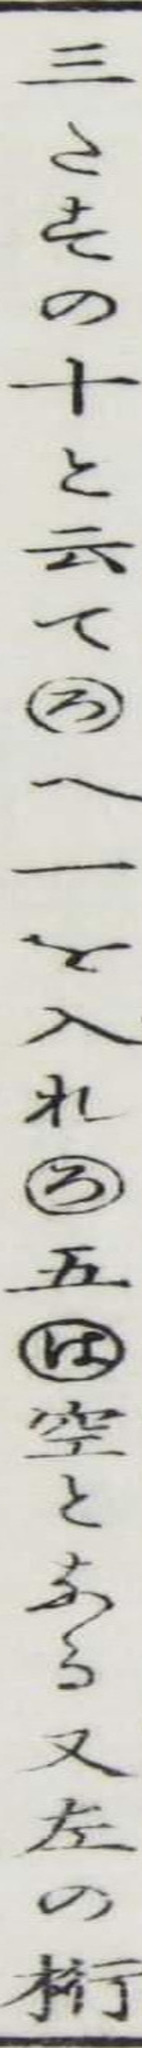三たすの十と云て㋺へ一を入れ㋺五㋩空となる又左の桁
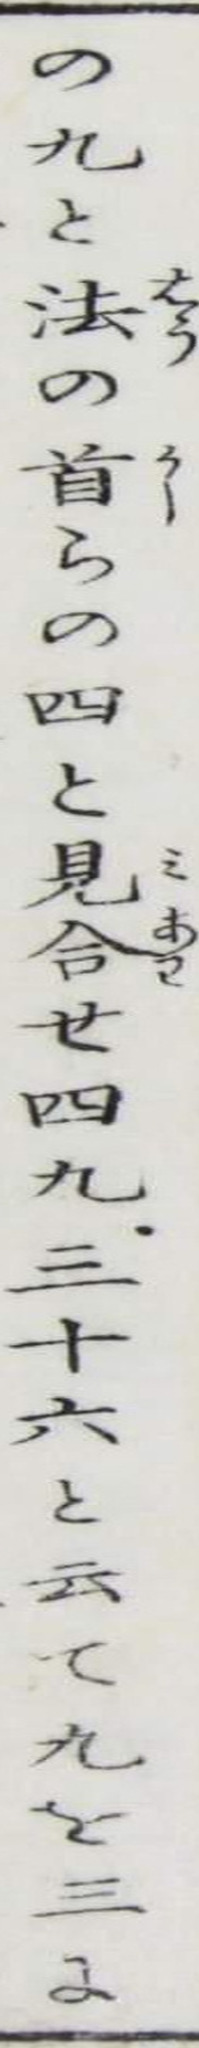の九と法の首らの四と見合せ四九．三十六と云て九を三に
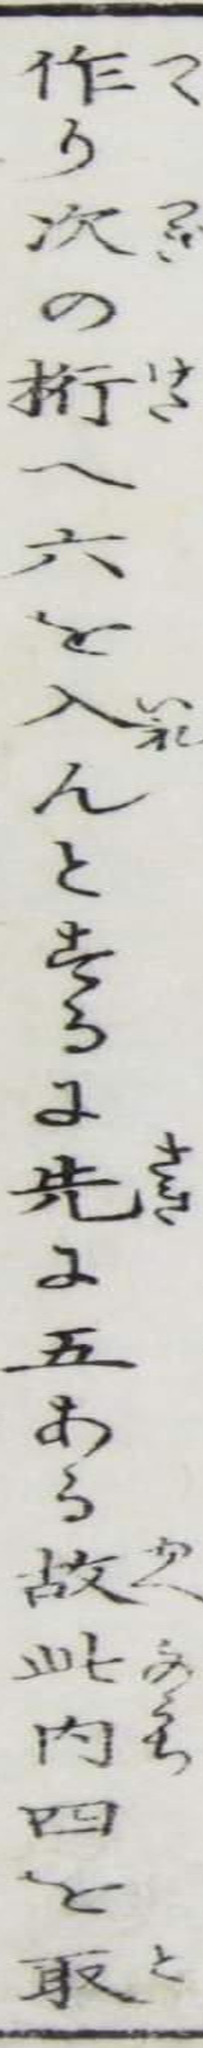作り次の桁へ六を入んとするに先に五ある故此内四を取
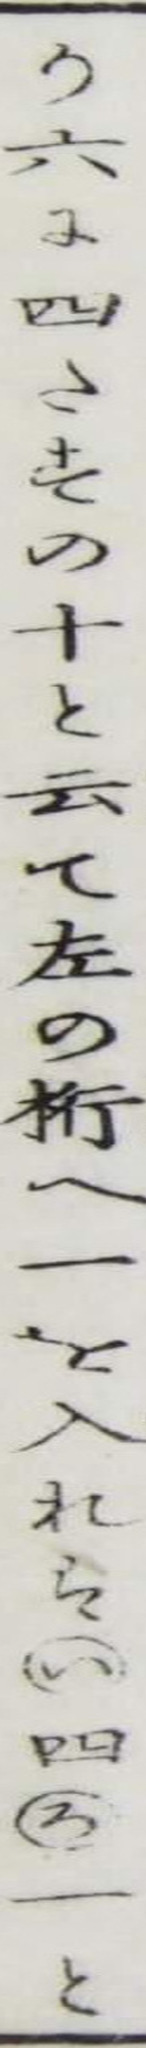り六に四たすの十と云て左の桁へ一を入れは㋑四㋺一と

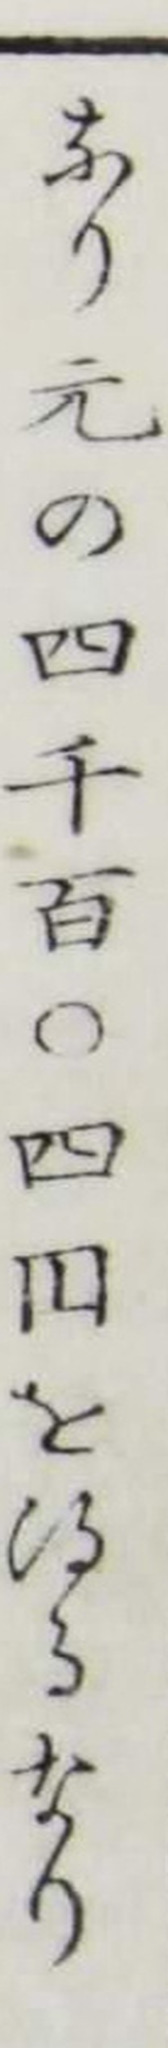なり元の四千百〇四円を得るなり
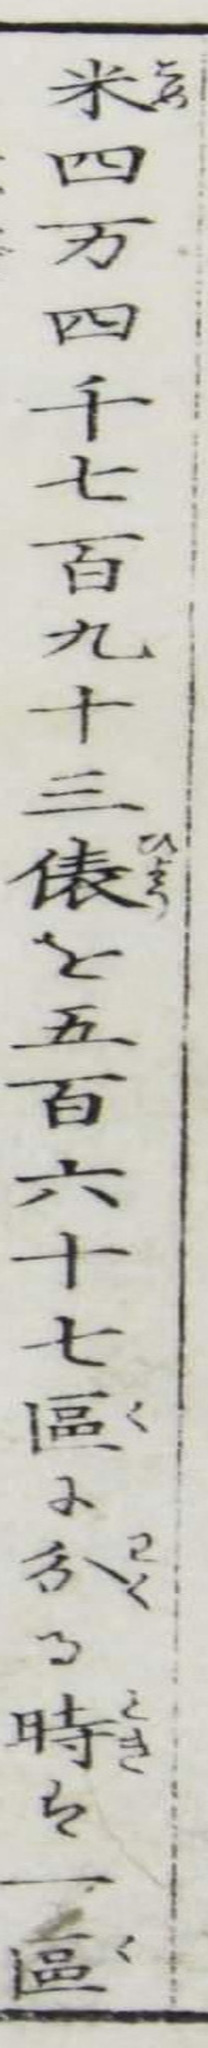米四万四千七百九十三俵を五百六十七区に分る時は一区
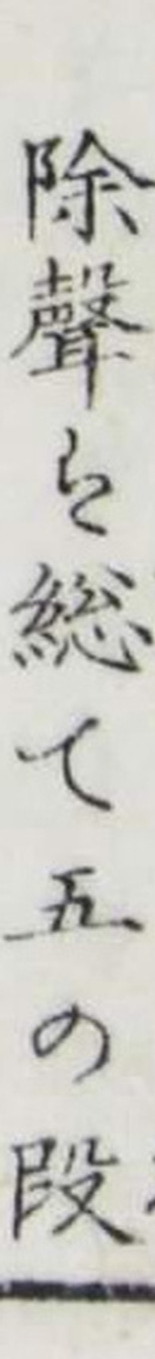除声は総て五の段
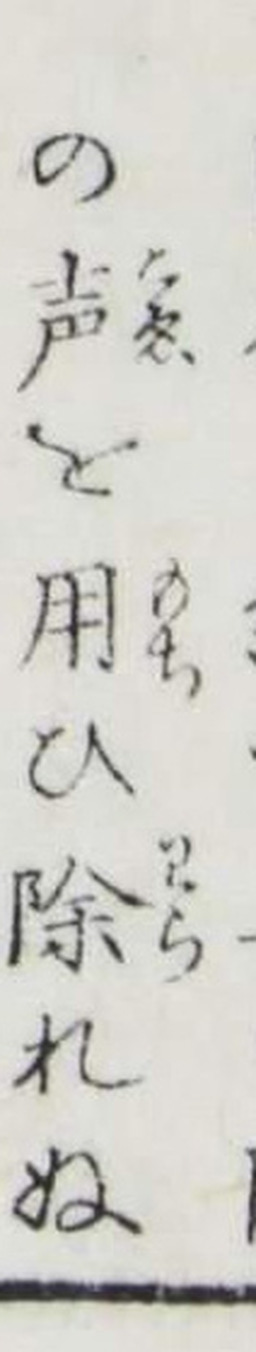の声を用ひ除れぬ
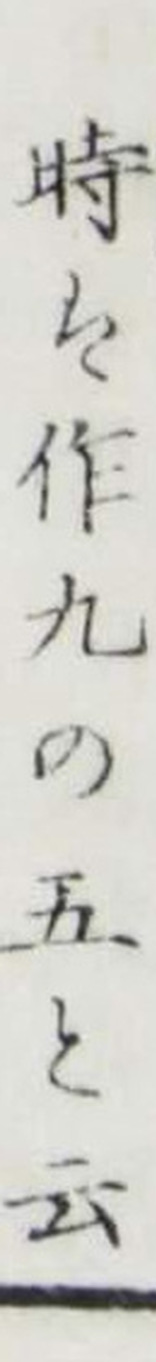時は作九の五と云
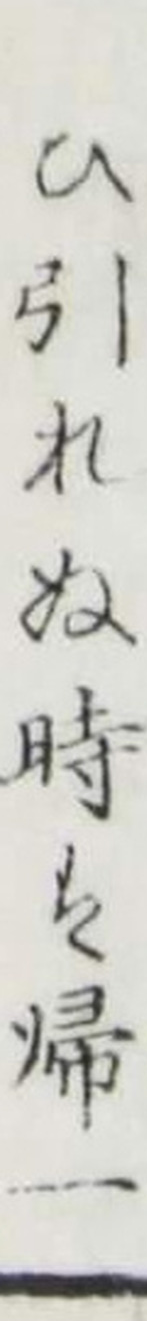ひ引れぬ時は帰一
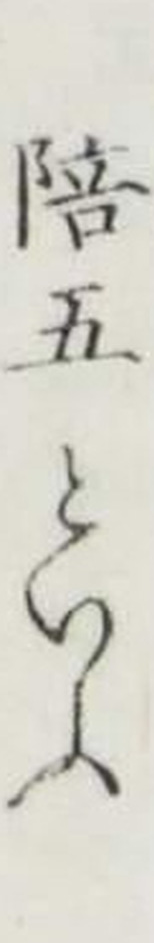陪五といふ
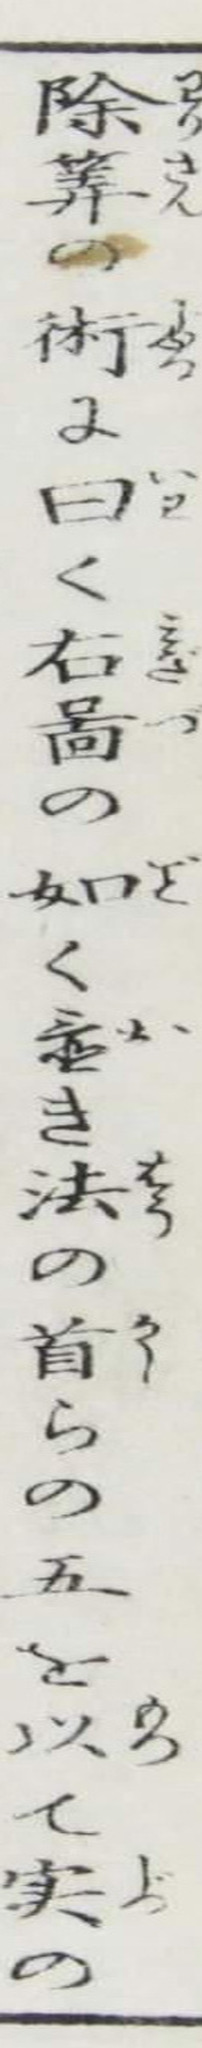除算の術に曰く右図の如く置き法の首らの五を以て実の
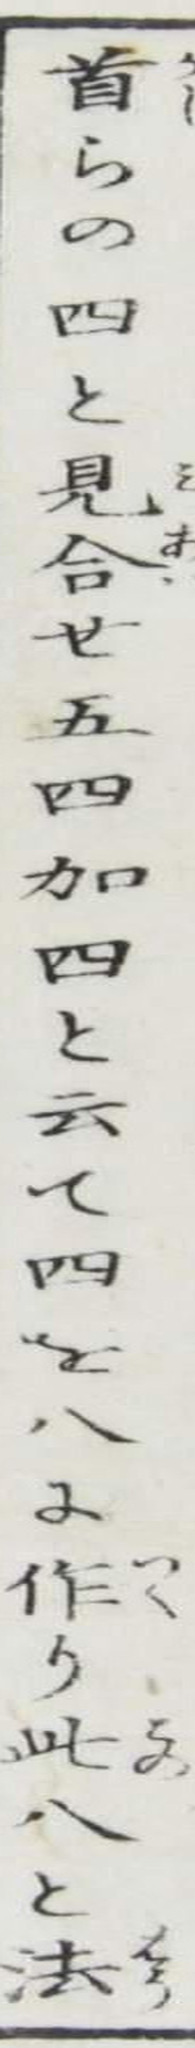首らの四と見合せ五四加四と云て四を八に作り此八と法
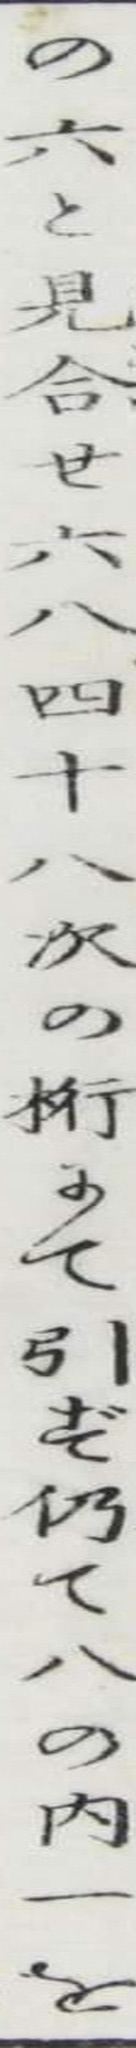の六と見合せ六八．四十八次の桁にて引ず仍て八の内一を
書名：明治小學塵劫記 卷1
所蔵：東京学芸大学教育コンテンツアーカイブ
